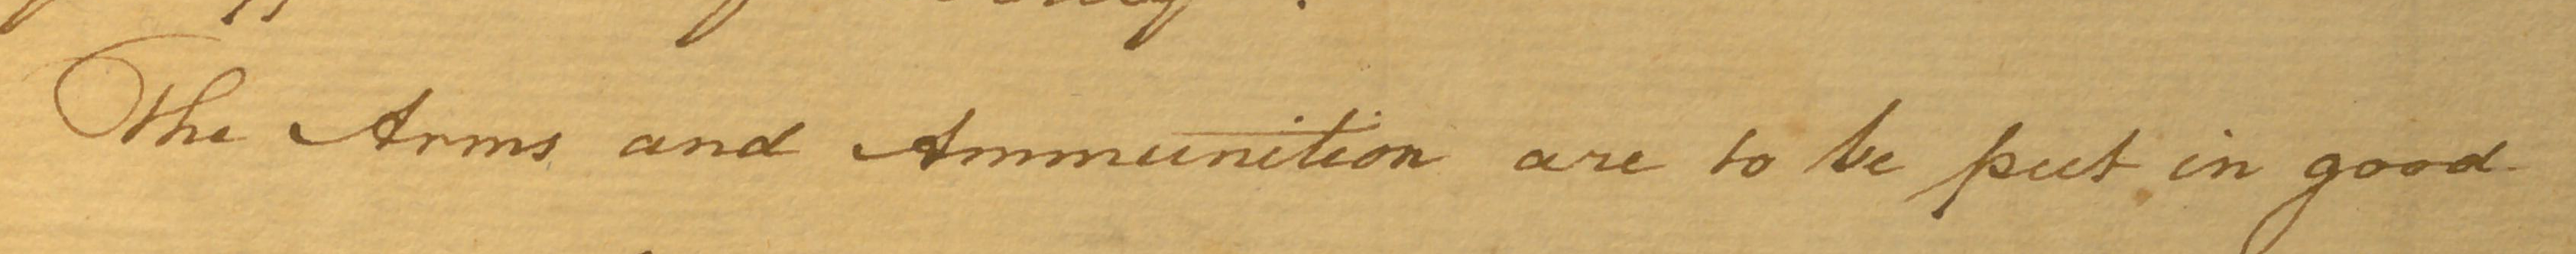The Arms and Ammunition are to be put in good
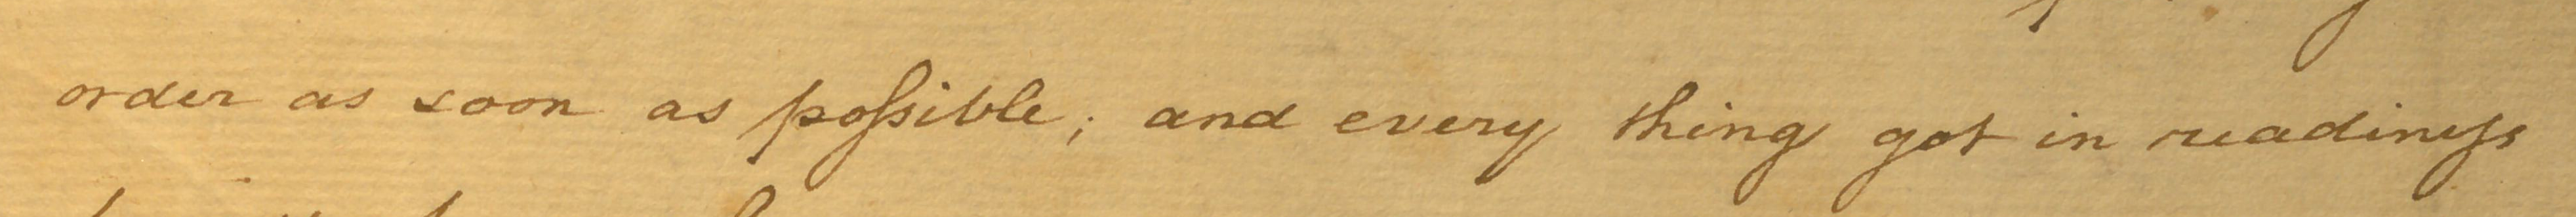order as soon as possible; and every thing got in readiness
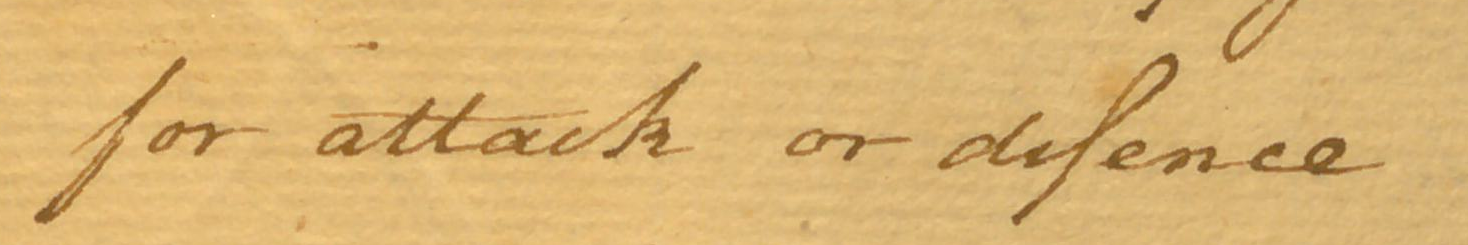for attack or defence
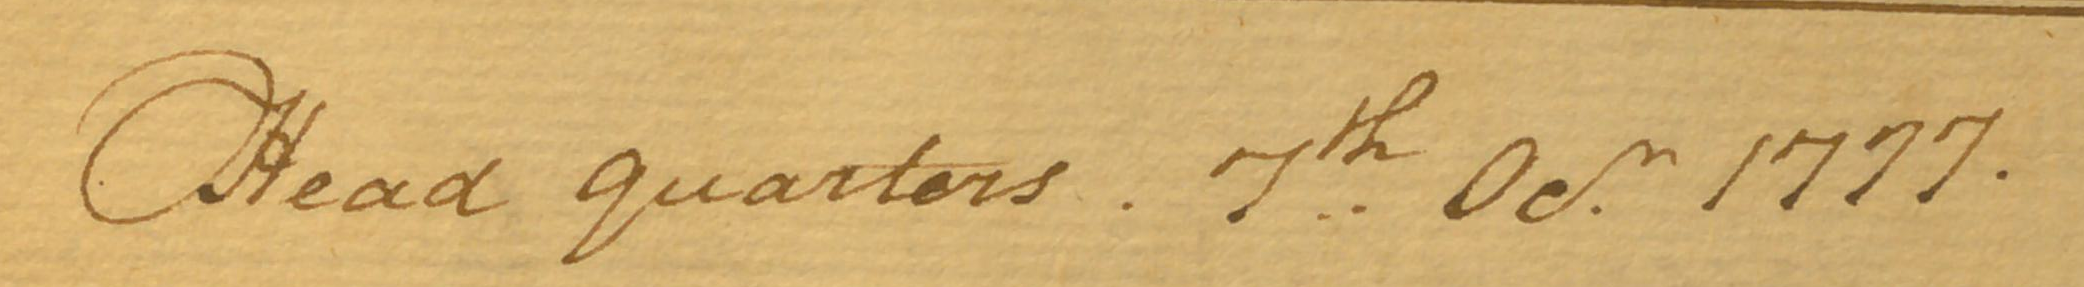Head quarters. 7^th Oc^r. 1777.
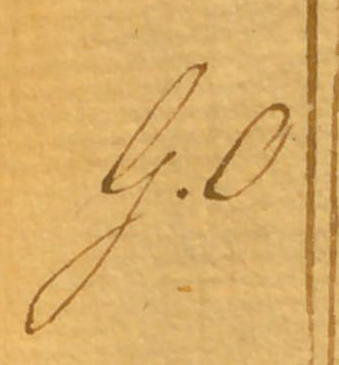G.O
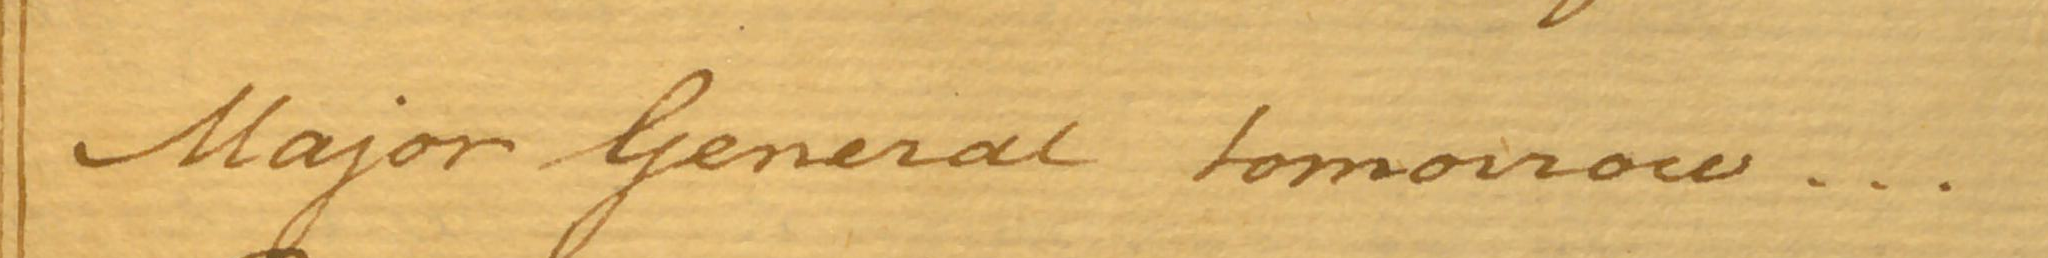Major General tomorrow...
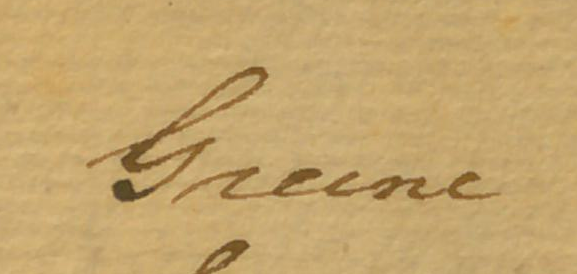Greene
